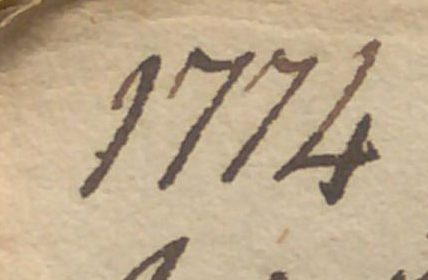1774
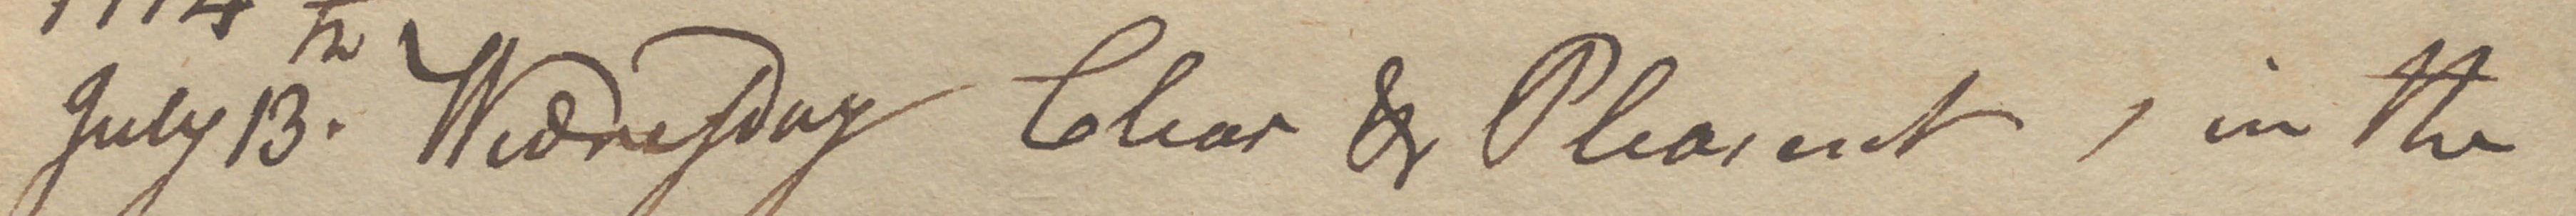July 13^th. Wednesday Clear & Pleasent, in the
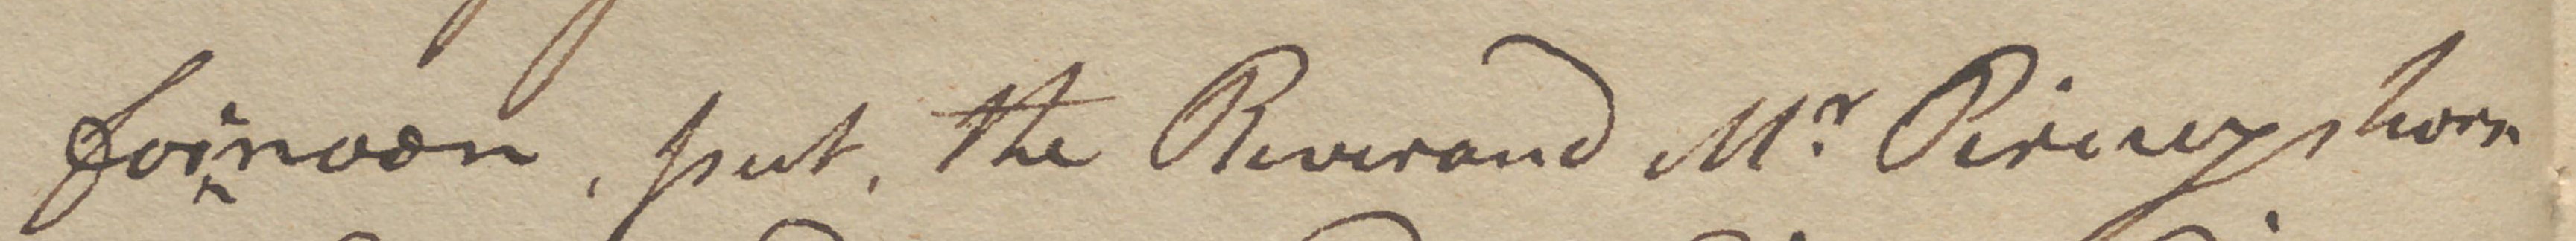fornoon, put, the Reverand M^r. Pirceys horse
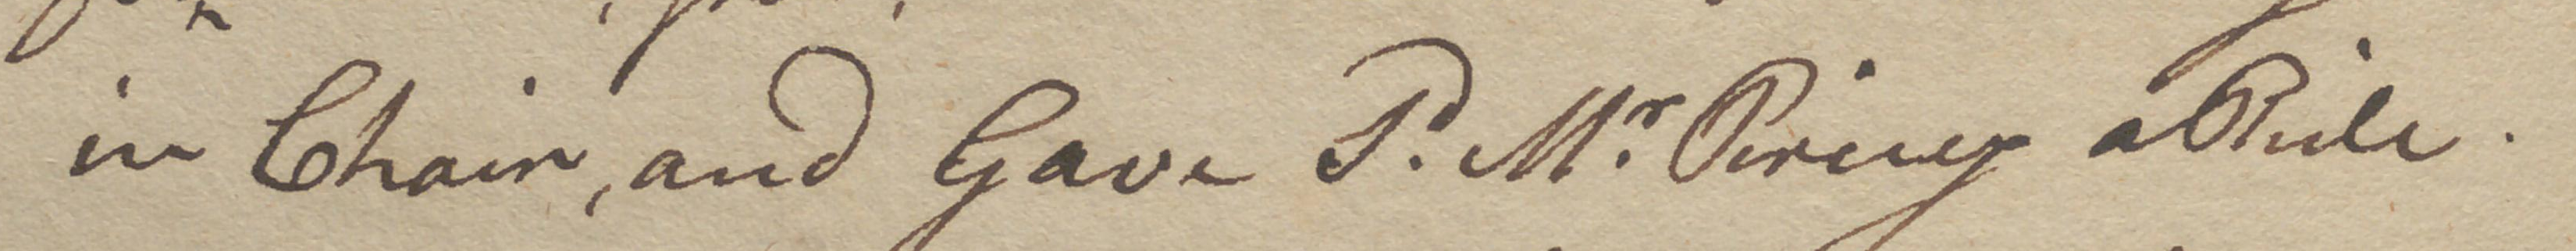in Chair, and Gave s^d. M^r. Pircey a Ride.
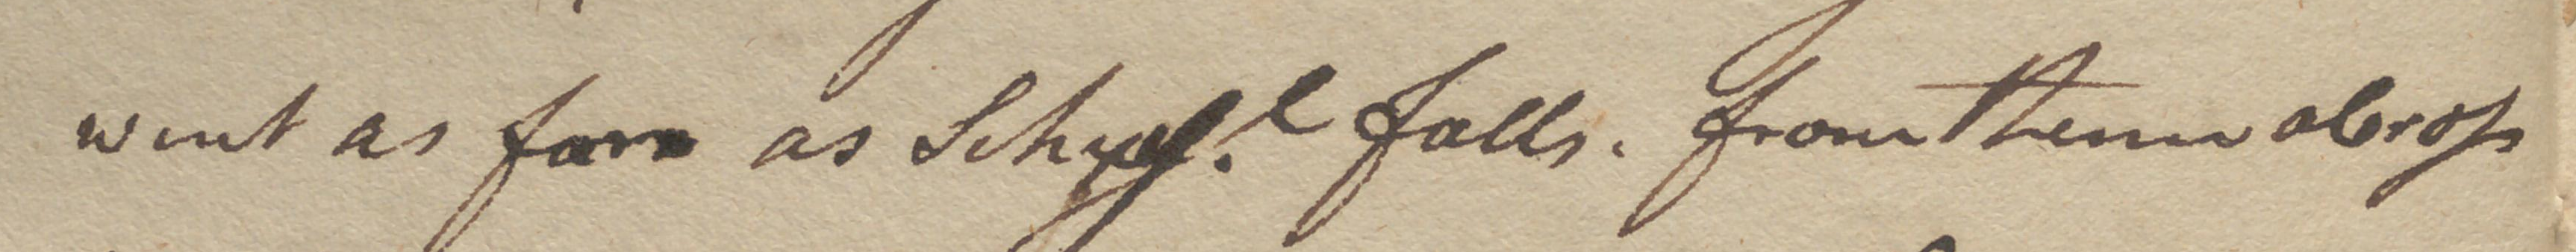went as far as Schuy^l. falls. from thence aCross
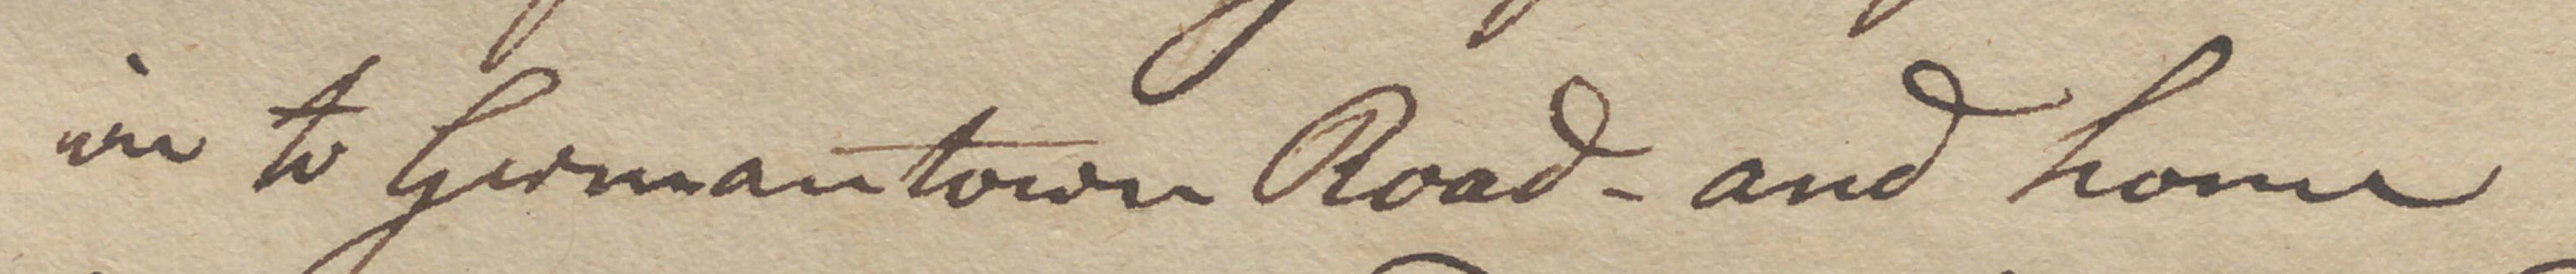in to Germantown Road- and home
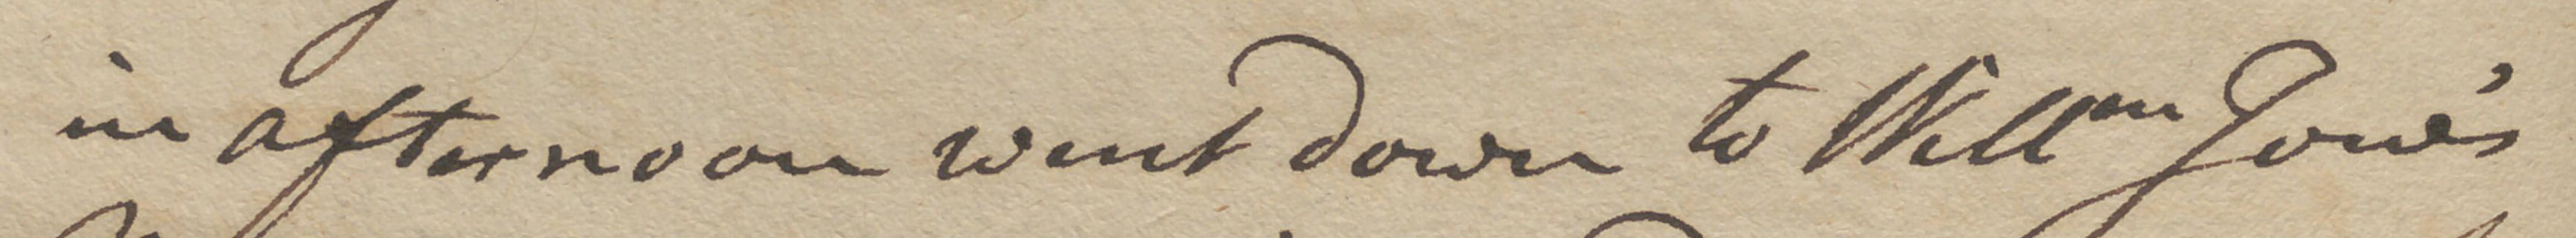in afternoon went down to Will^m Jone's
